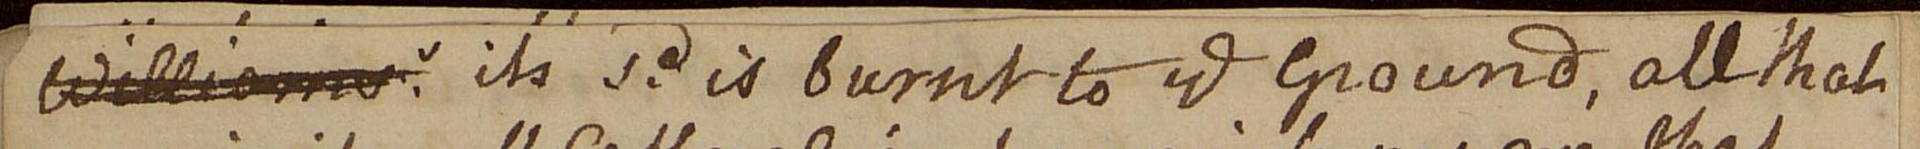[Williams]^s. its s^d. is burnt to y^e Ground, all that
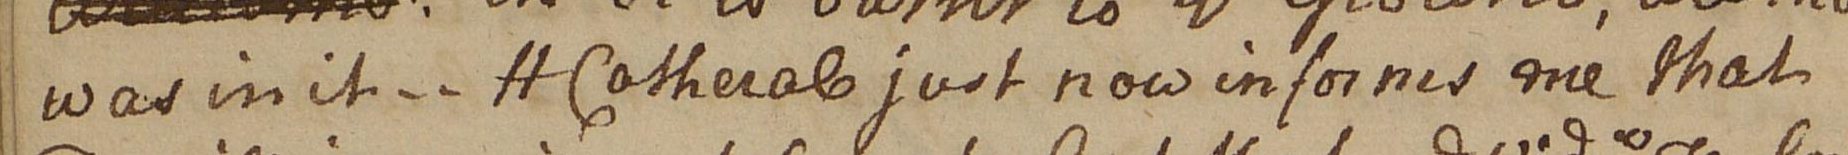was in it- - H Catheral just now informs me that
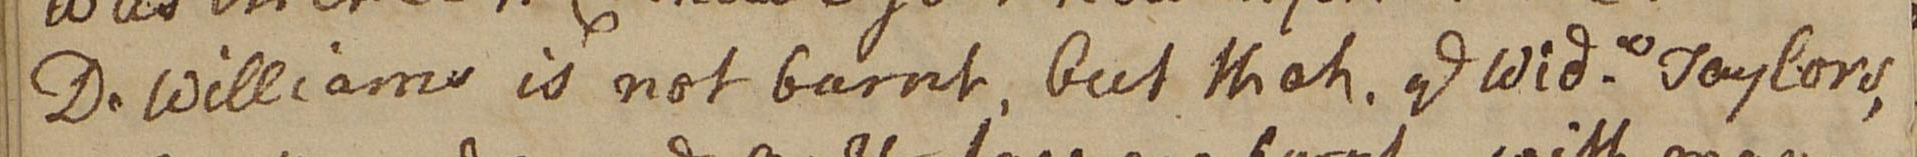D. Williams is not burnt, but that y^e Wid^w. Taylors,
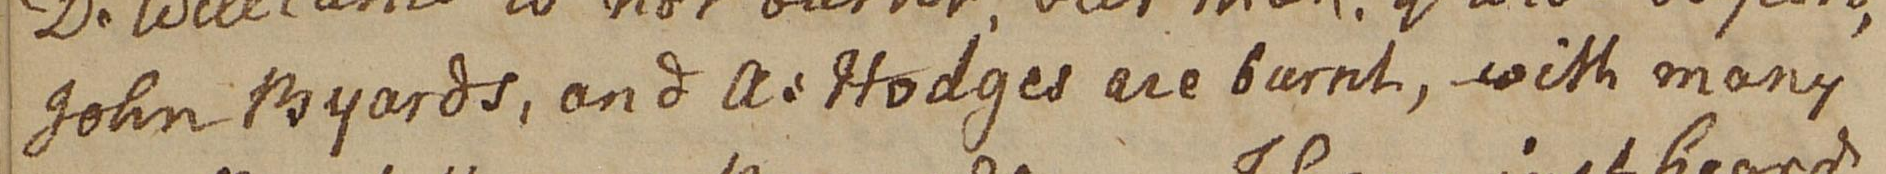John Byards, and A: Hodges are burnt, with many
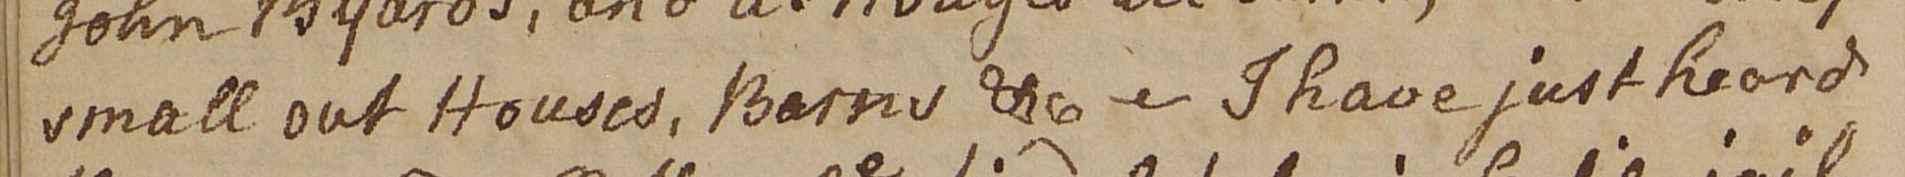small out Houses, Barns &c - I have just heard
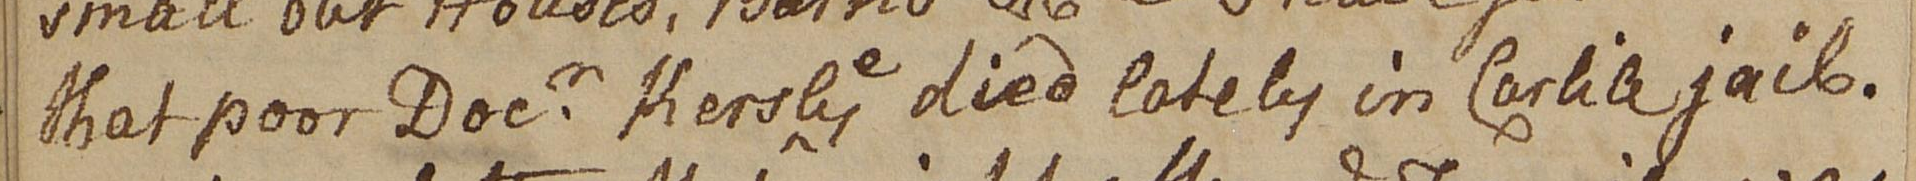that poor Doc^r. Kersly^e died lately in Carlile jail.
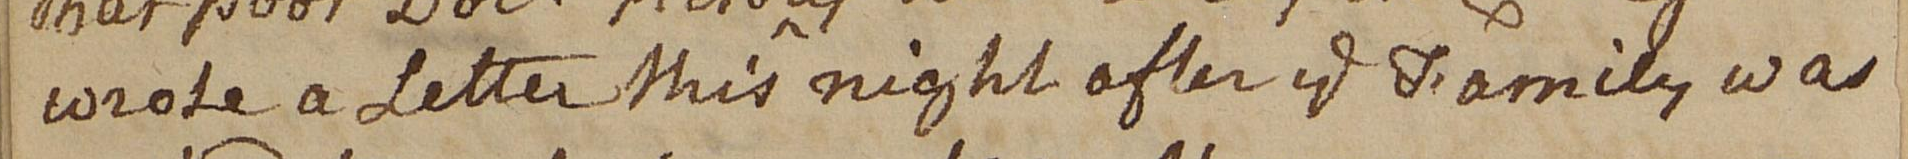wrote a Letter this night after y^e Family was
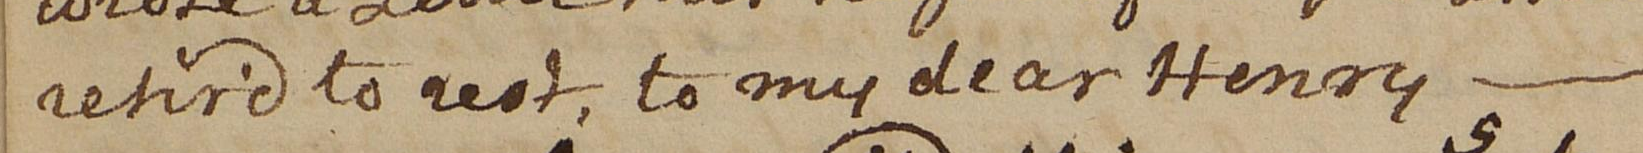retir'd to rest, to my dear Henry-
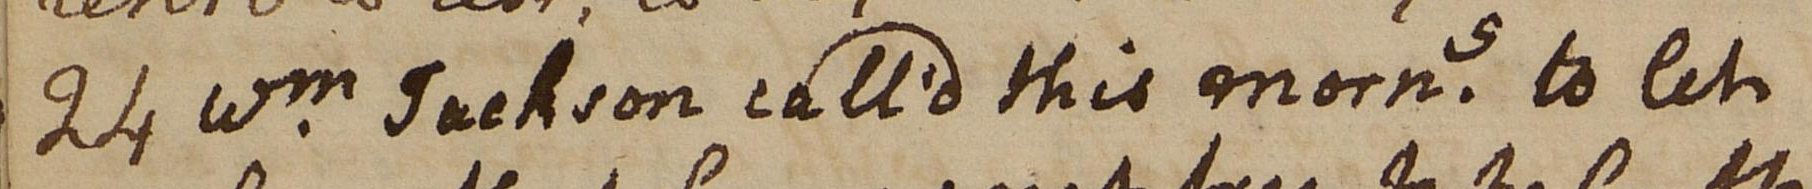24 W^m. Jackson call'd this morn^g. to let
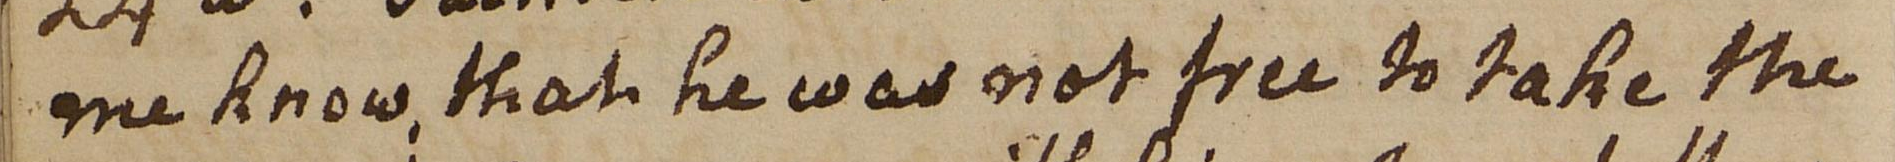me know, that he was not free to take the
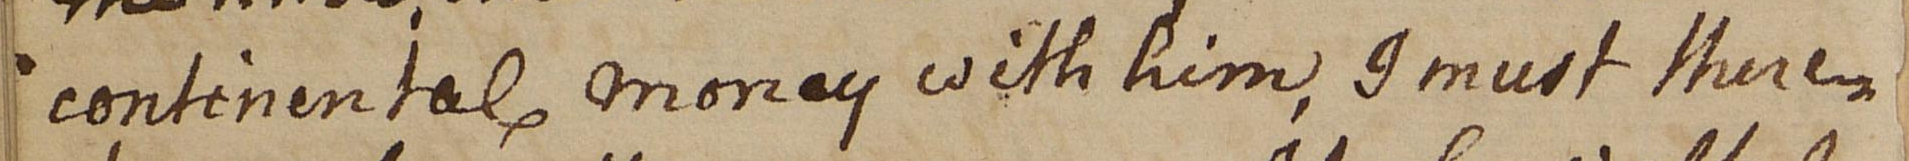continental money with him, I must there
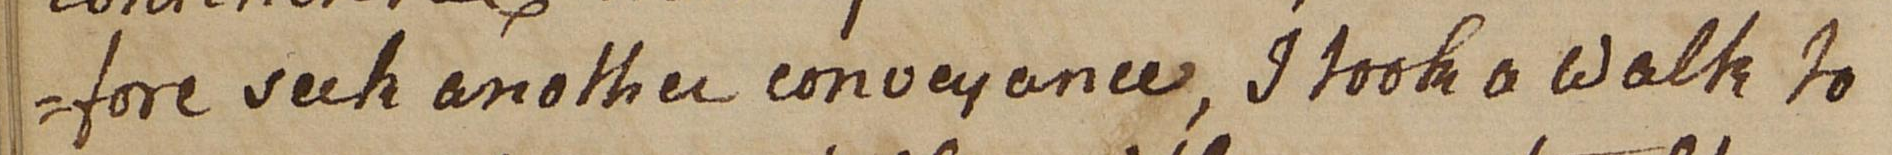-fore seek another conveyance, I took a Walk to
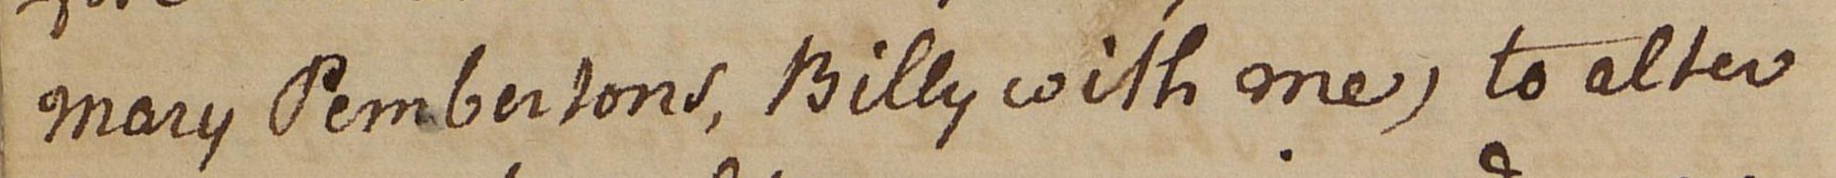Mary Pembertons, Billy with me, to alter
